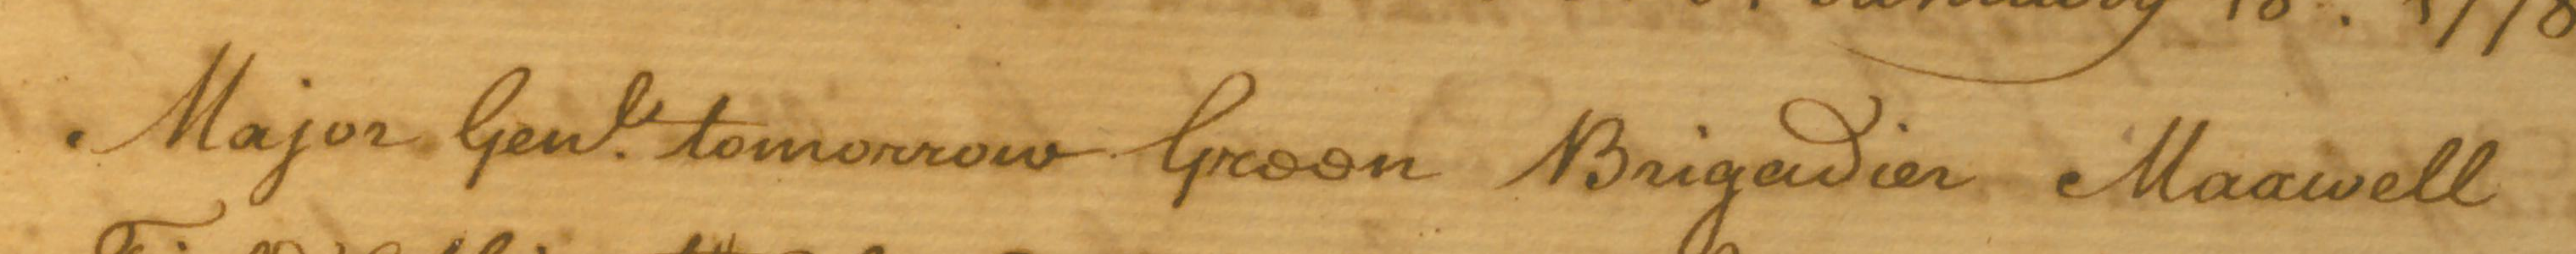Major Gen^l. tomorrow Green Brigadier Maxwell
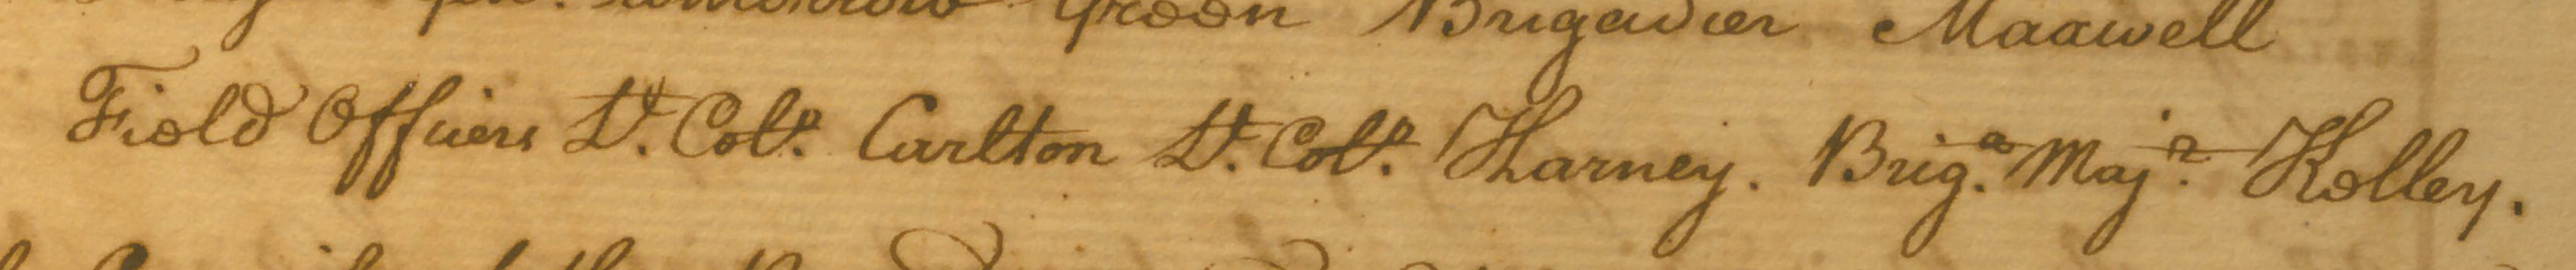Field Officers L^t. Col^o. Carlton L^t. Col^o. Harney. Brig^a. Maj^r. Kelley.
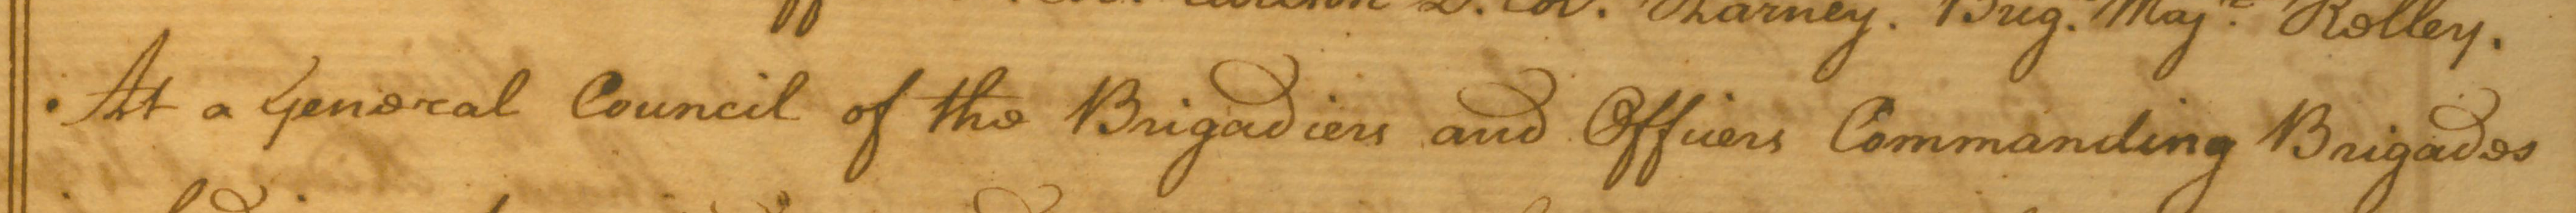At a General Council of the Brigadiers and Officers Commanding Brigades
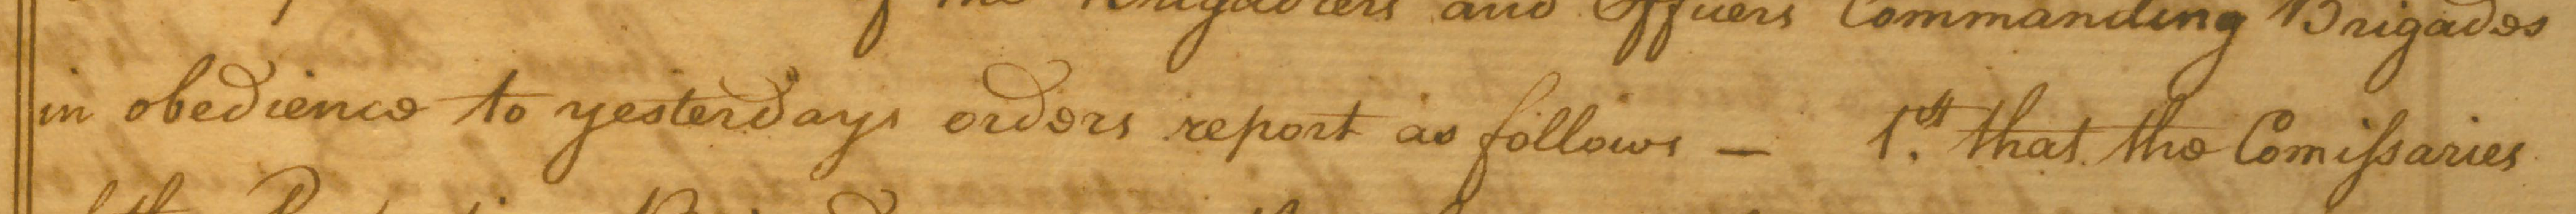in obedience to yesterdays orders report as follows- 1^st. that the Comissaries
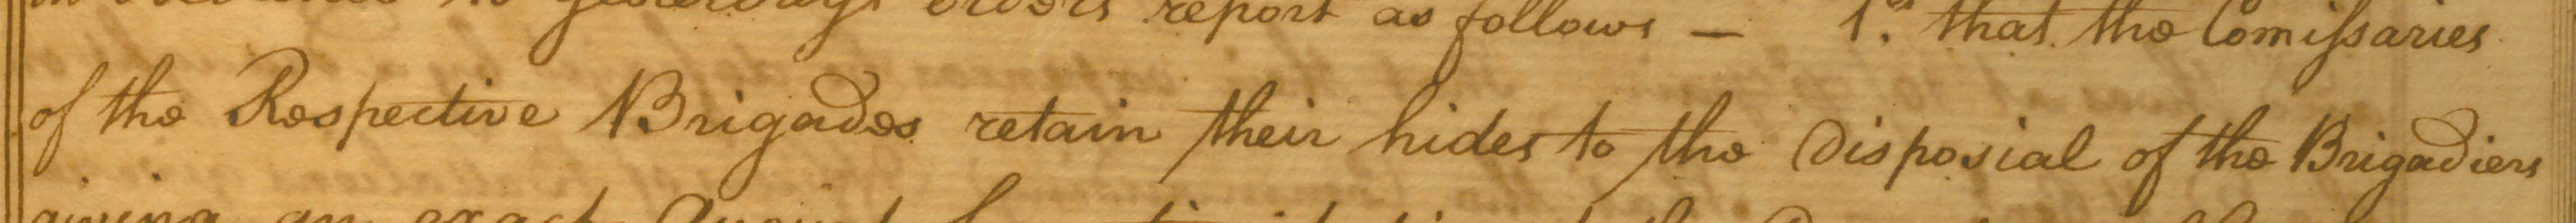of the Respective Brigades retain their hides to the disposial of the Brigadiers
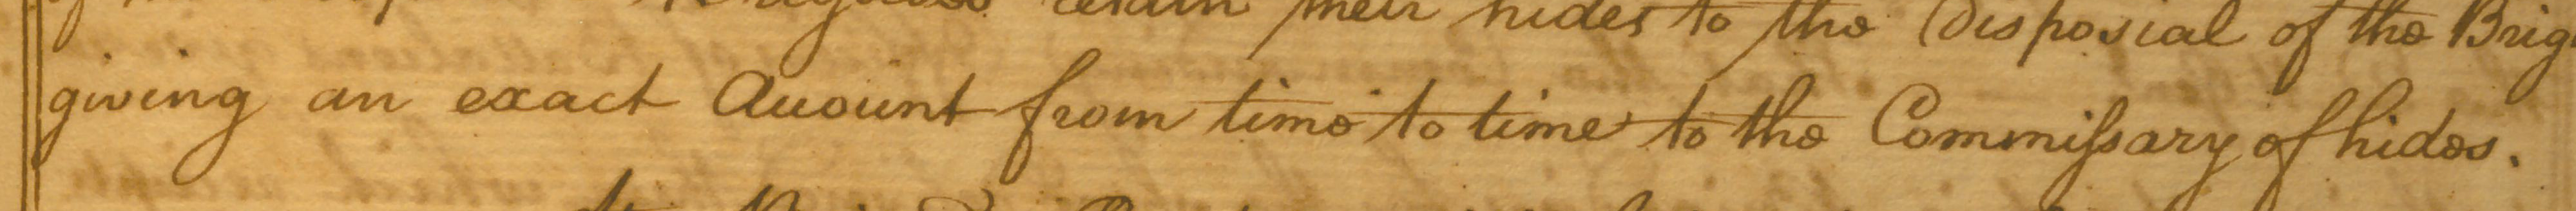giving an exact Account from time to time to the Commissary of hides.
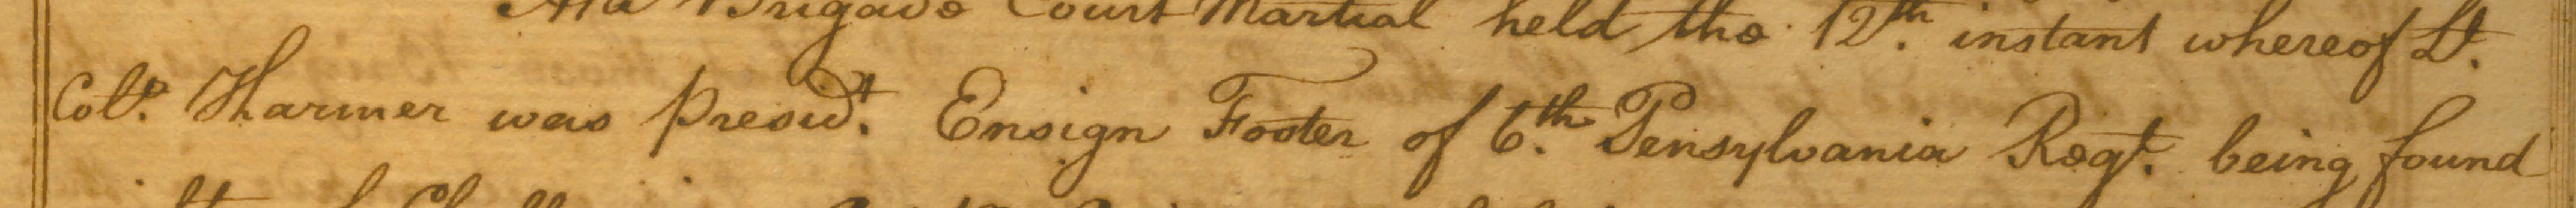Col^o. Harmer was presid^t. Ensign Foster of 6^th. Pensylvania Reg^t. being found
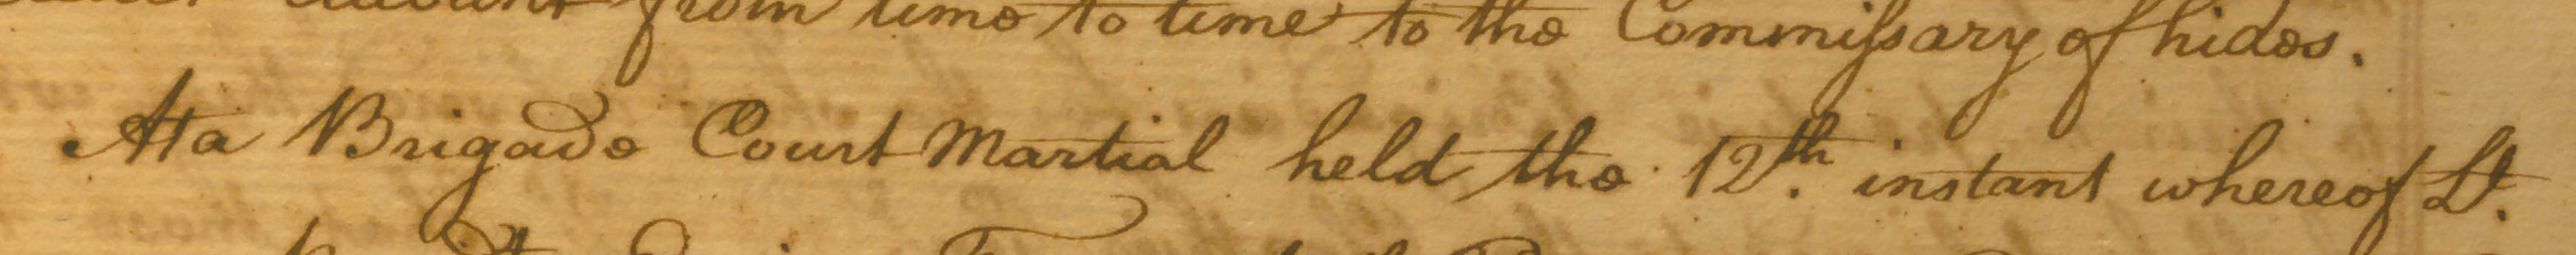At a Brigade Court Martial held the 12^th. instant whereof L^t.
